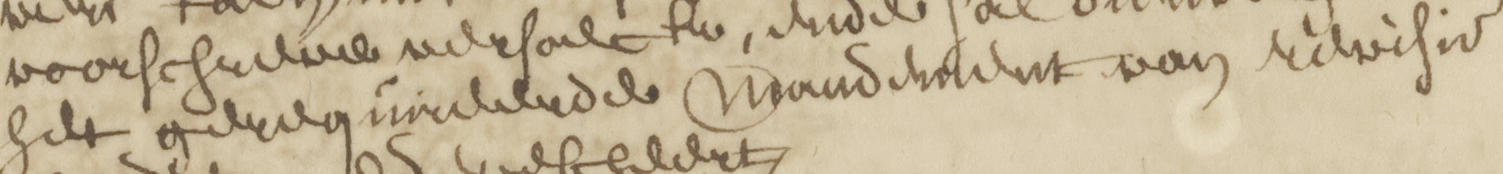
het gerequireerde Mandement van revisie
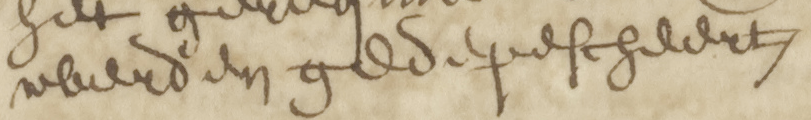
werden gedepescheert.
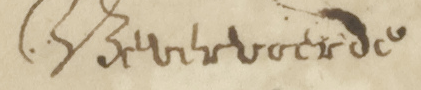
Bevervoerde
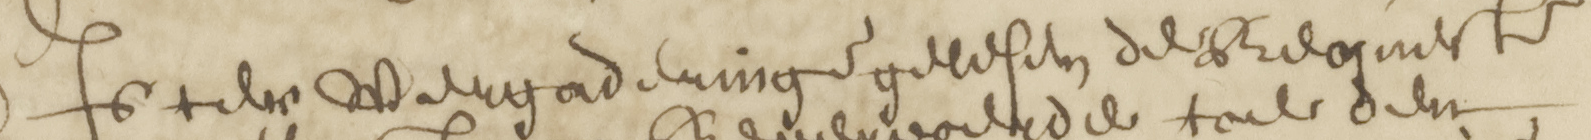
Is ter Vergaderinge gelesen de Requeste
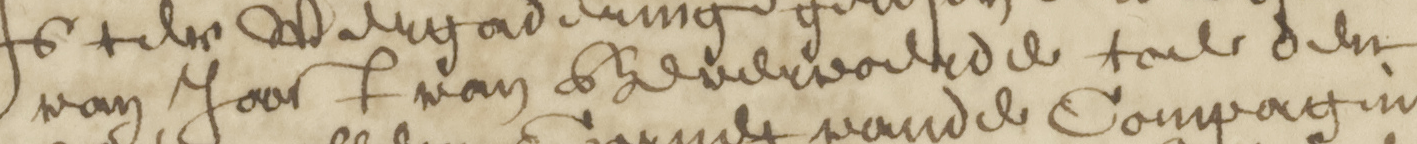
van Joost van Bevervoerde toe den
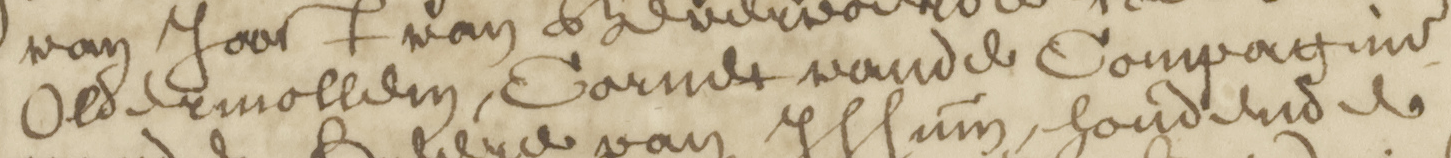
Oldermollem, Cornet vande Compagnie
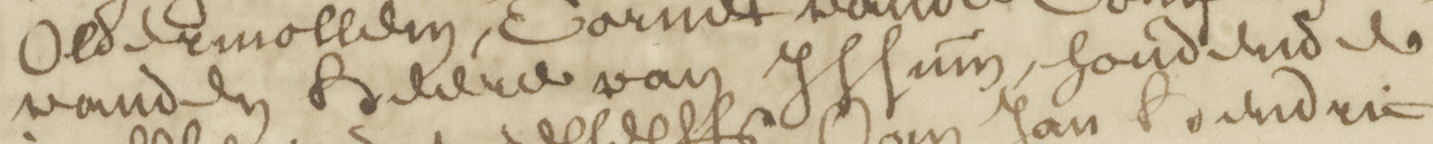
vanden Heere van Issum, houdende
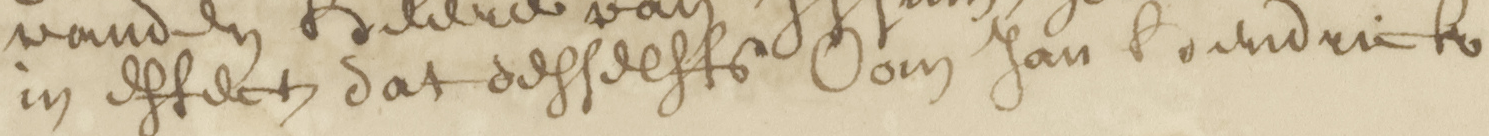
in effect, dat desselfs Om Jan Hendrick
